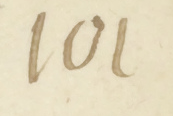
101
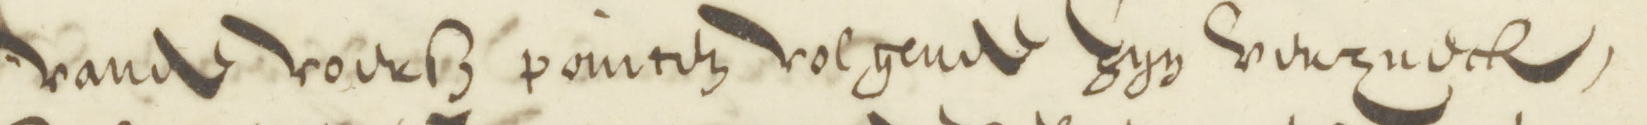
vande voers pointen volgende zyn verzueck,
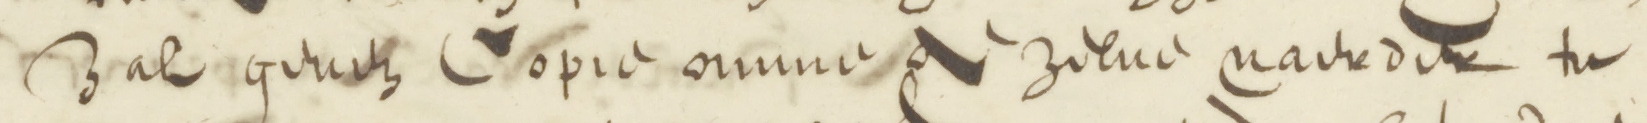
zal geuen Copie omme de zelve naerder te
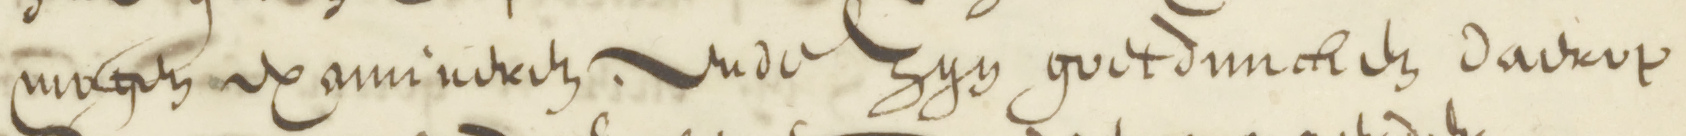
mogen examineren, ende zyn goetduncken daerop
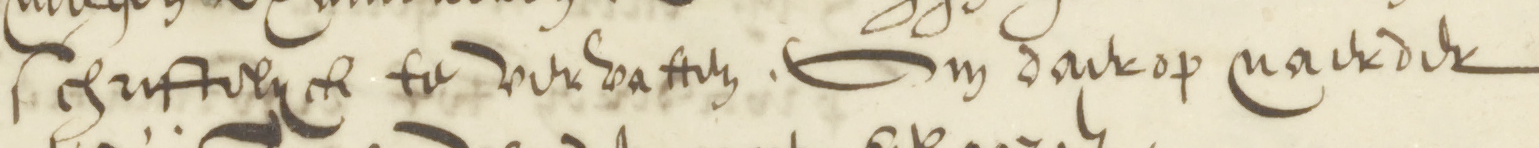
schriftelyck te vervatten, Om daerop naerder
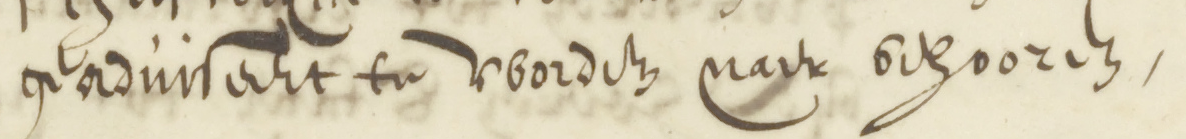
geaduiseert te worden naer behooren.
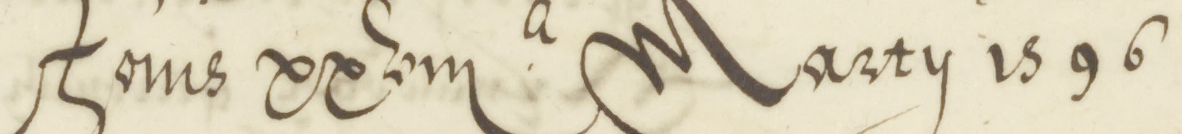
Iovis XXVIIIen Marty 1596
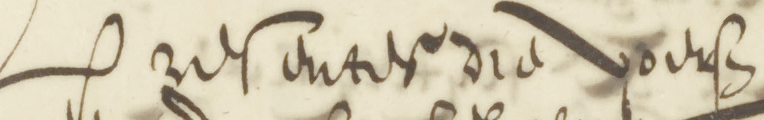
Presentes die voers
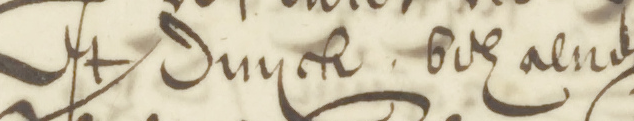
Duyck, behaluen
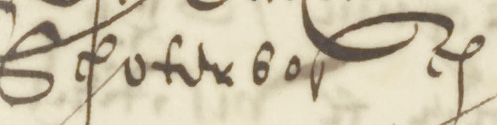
Schoterbosch
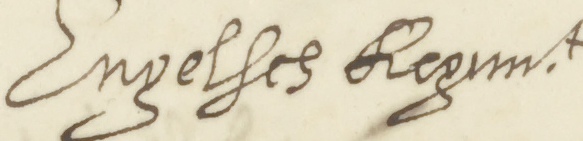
Engelsch Regimt.
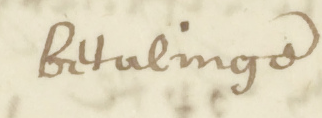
betalinge
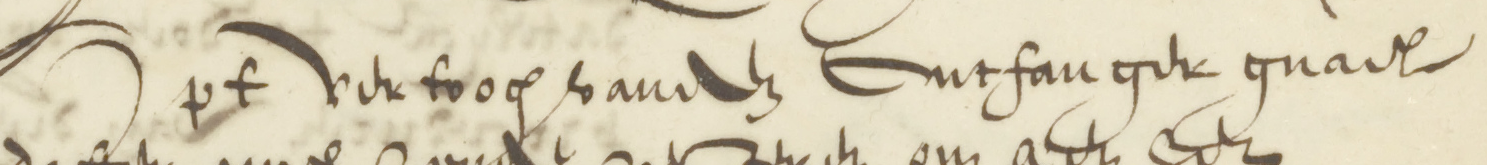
Opt vertooch vanden Ontfanger gnael
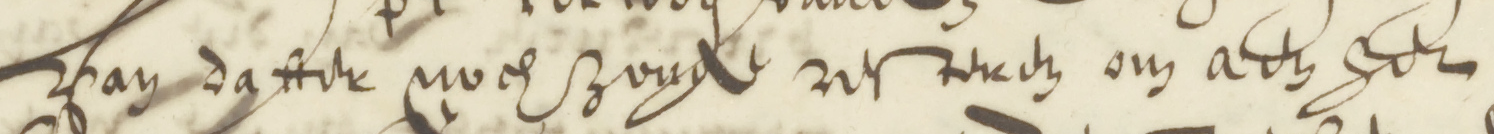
van datter noch zoude resteren om aen het
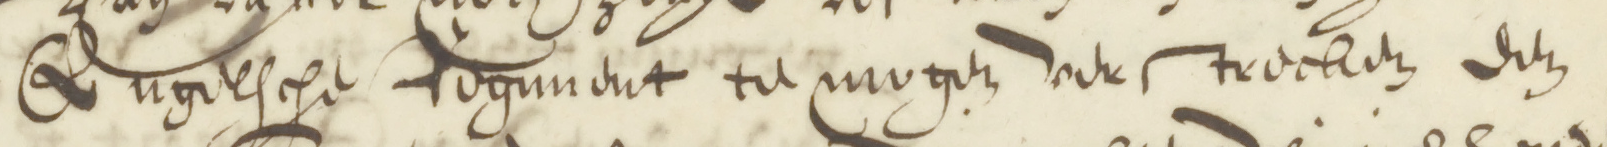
Engelsche Regiment te mogen verstrecken een
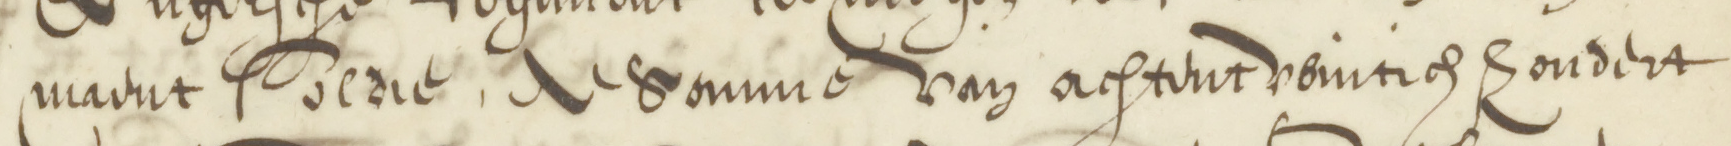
maent soldie, de Somme van achtentwintich hondert
